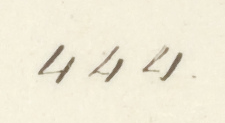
444.
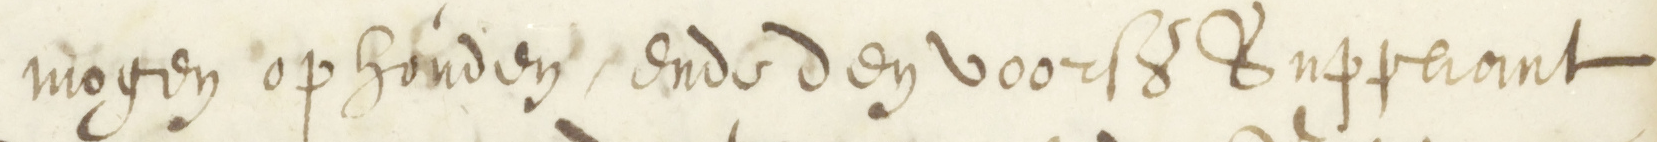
mogen ophouden, ende den voors Suppliant
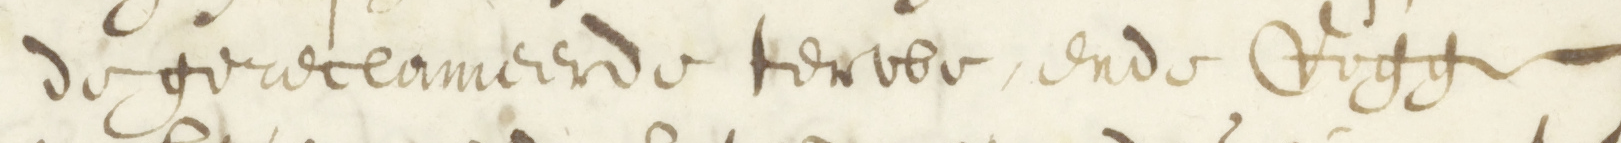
de gereclameerde terwe, ende Rogge
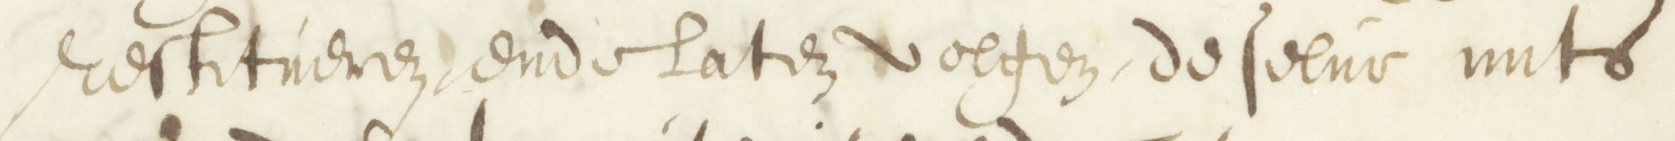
restitueren, ende laten volgen, deselue mits
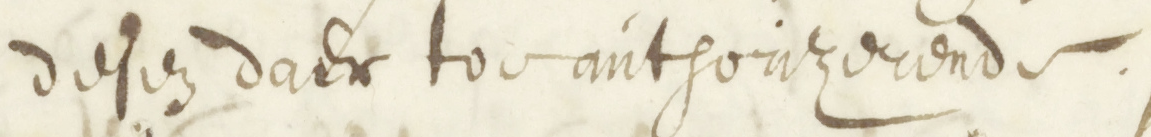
desen daer toe authorizerende.
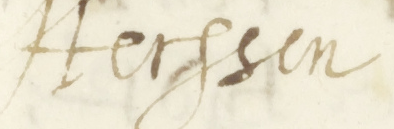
Aerssen
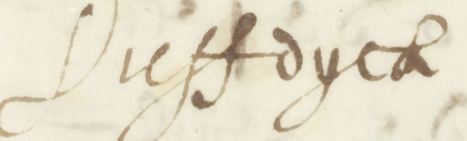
Dieffdyck
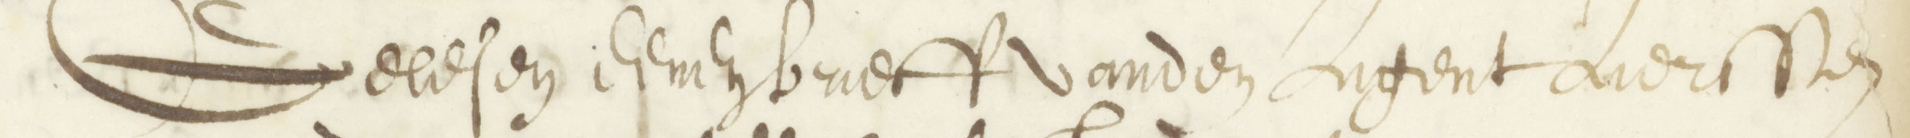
Gelesen eenen brieff vanden Agent Aerssen
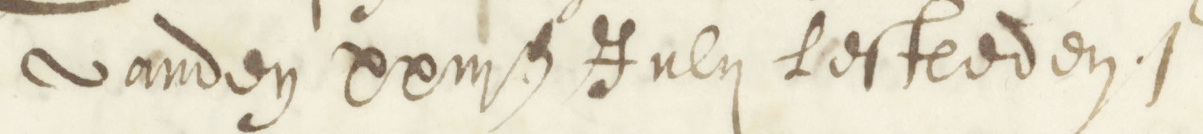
vanden xxiijen July lestleden.
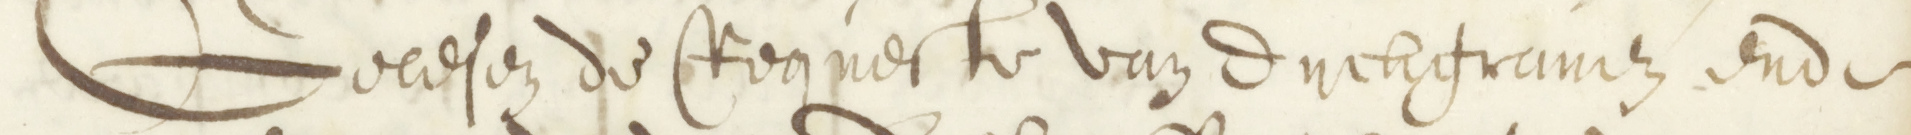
Gelesen de Requeste van dyckgrauen ende
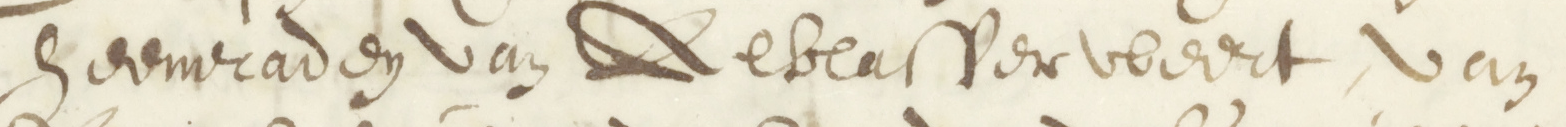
heemraden van Alblasserweert, van
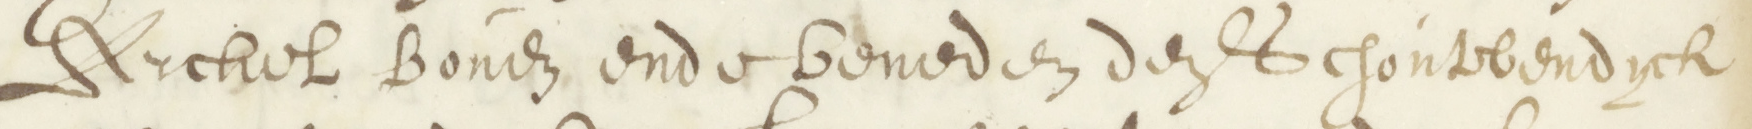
Arckel bouen ende beneden den Schouwendyck
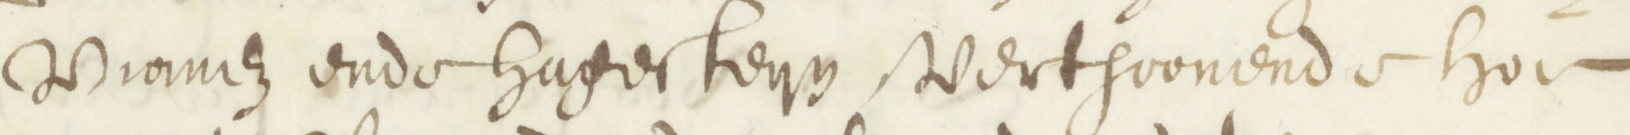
Vianen ende hagesteyn, verthoonende hoe
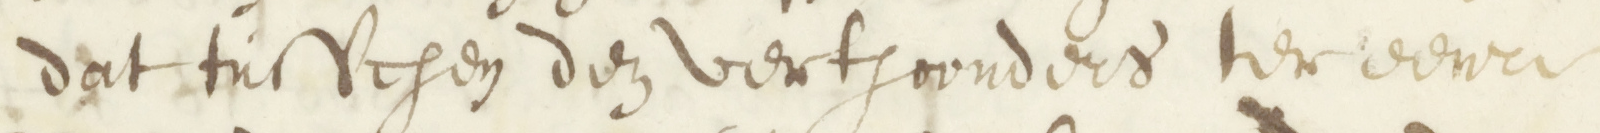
dat tusschen den verthoonders ter eenre,
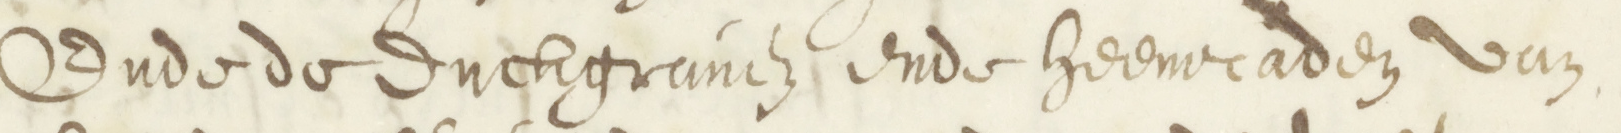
Ende de dyckgrauen ende heemraden van
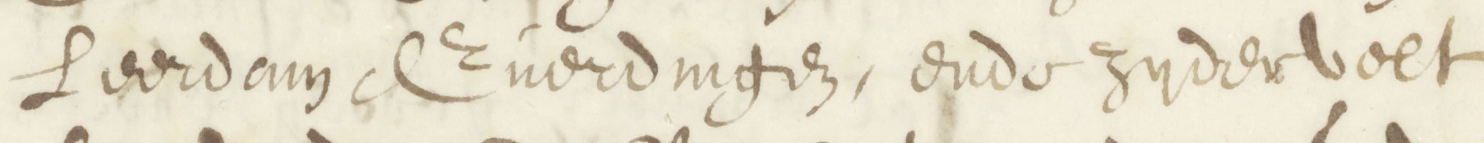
Leerdam, Euerdingen, ende zydervelt
